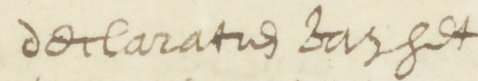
declaratien van het
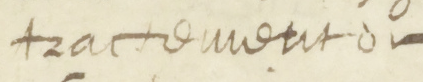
tractement de
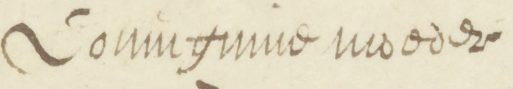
Coninginne moeder
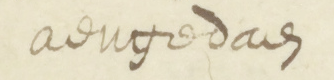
aengedaen
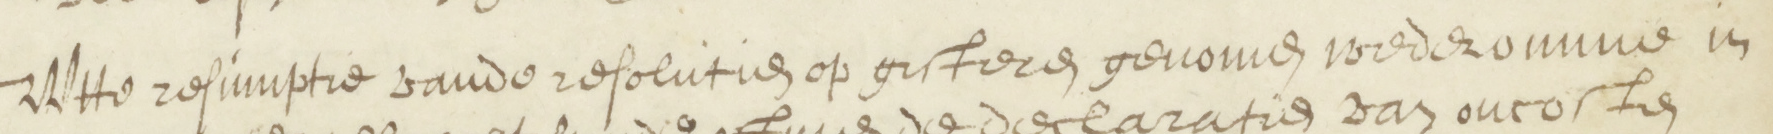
Wtte resumptie vande resolutien op gisteren genomen wederomme in
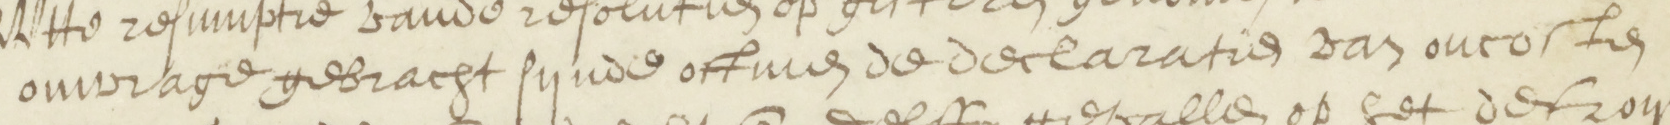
omvrage gebracht synde off men de declaratien van oncosten
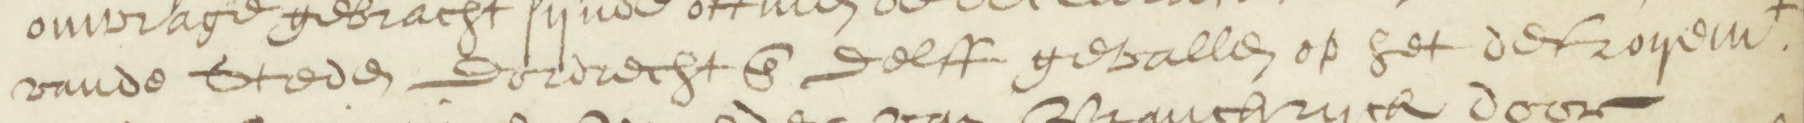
vande Steden Dordrecht & Delff gevallen op het defroyemt.
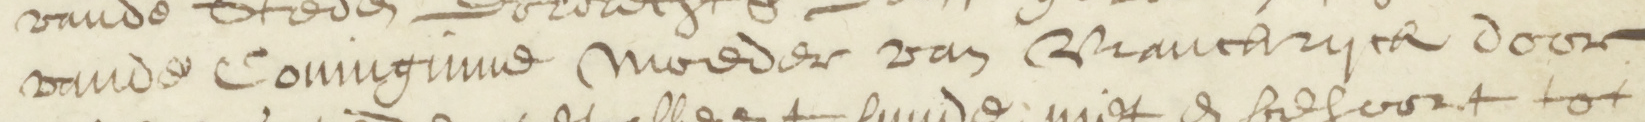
vande Coninginne Moeder van Vranckryck door
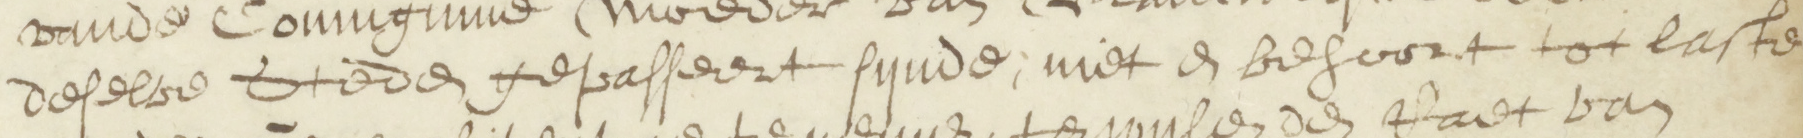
deselve Steden gepasseert synde, niet en behoort tot laste
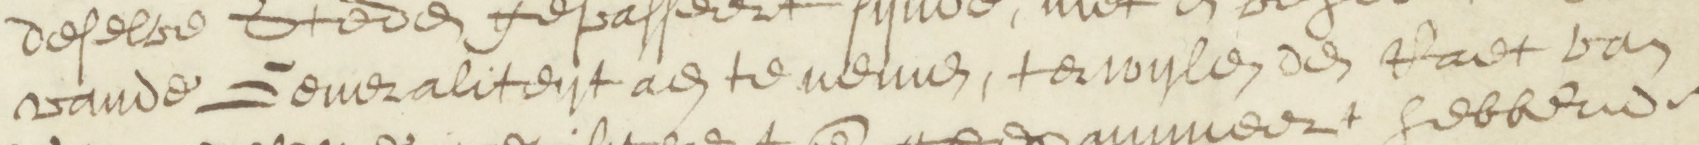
vande Generaliteyt aen te nemen, terwylen den Raet van
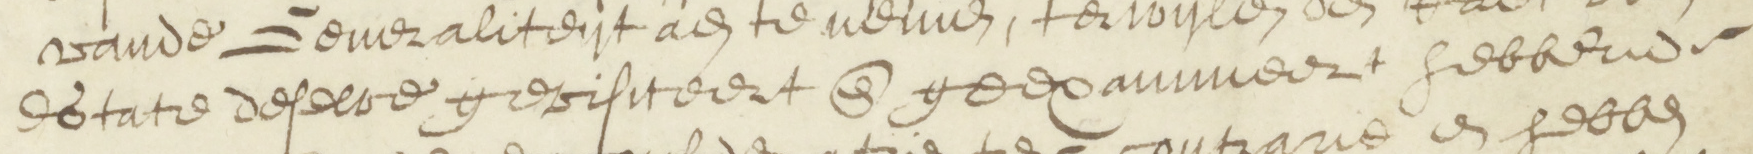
State deselve gevisiteert & geexamineert hebbende
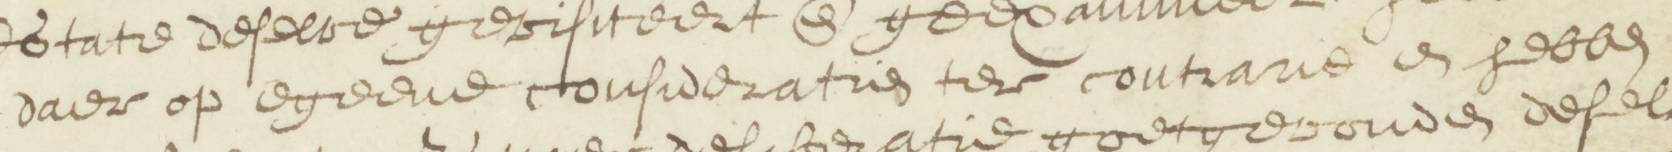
daer op egeene consideratien ter contrarie en hebben
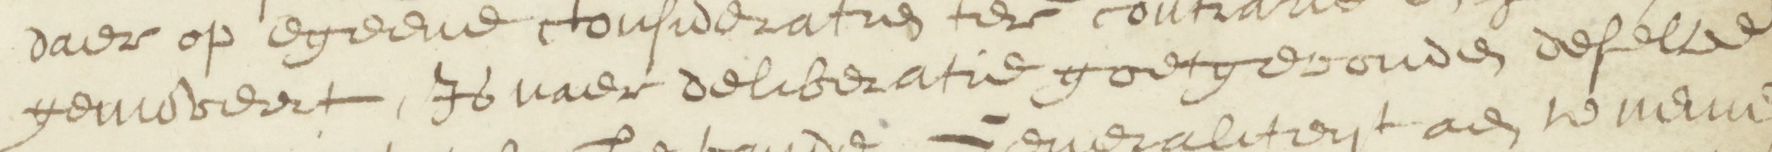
gemoveert, Is naer deliberatie goetgevonden deselve
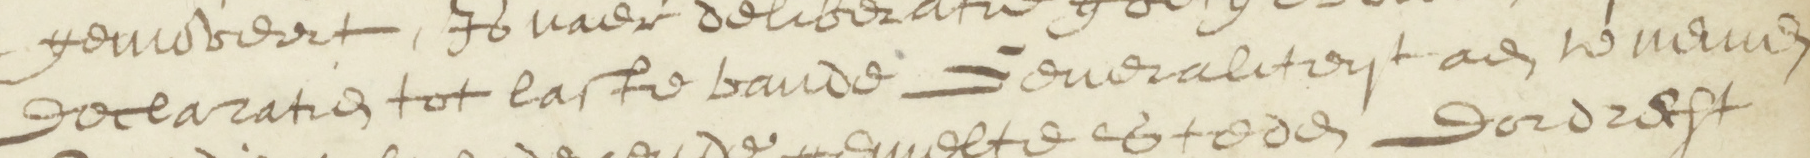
declaratien tot laste vande Generaliteyt aen te nemen
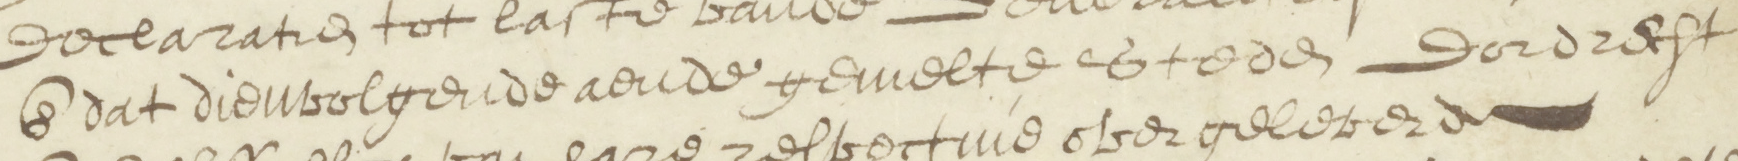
& dat dienvolgende aende gemelte Steden Dordrecht
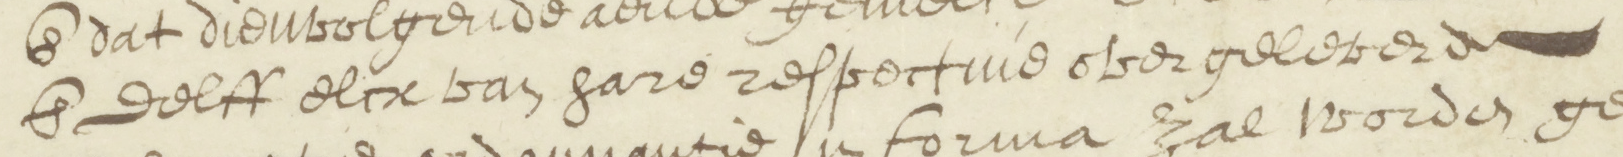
& Delff elcx van hare respectiue overgelevende
